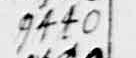9440
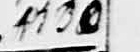4330
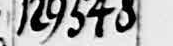129548
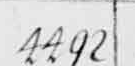4492
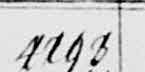4293
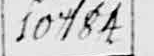10784
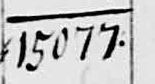15077.
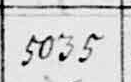5035
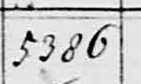5386
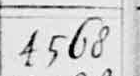4568
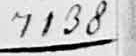7138
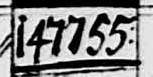147755
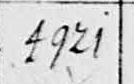4921
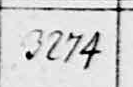3274
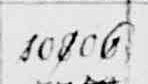10806
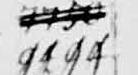9494
